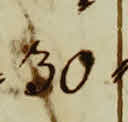30
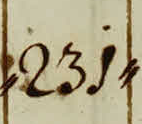231
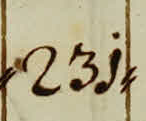231
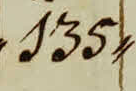135
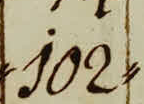102
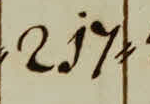217
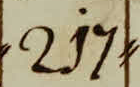217
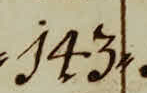143
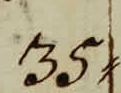35
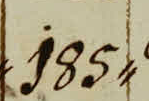185
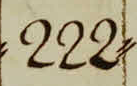222
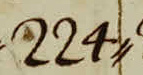224
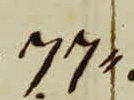77
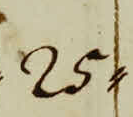25
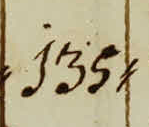135
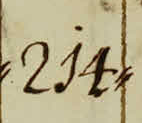214
